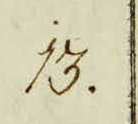13.
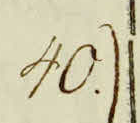40.
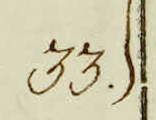33.
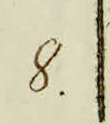8.
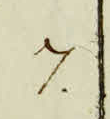7.
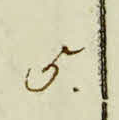5.
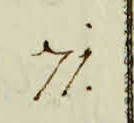71.
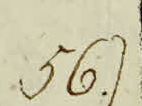56.
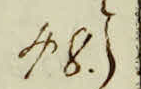48.
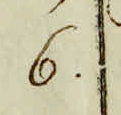6.
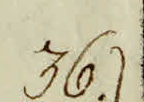36.
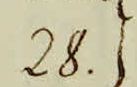28.
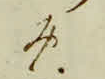4.
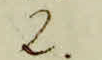2.
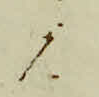1.
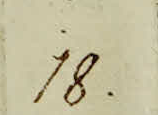18.
